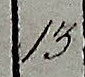13
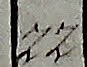22
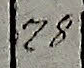28
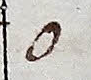0
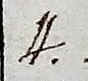4.
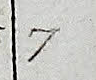7
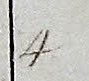4
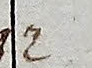2
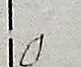0
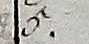5.
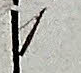1
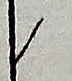1
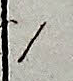1
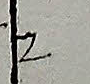2
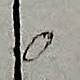0
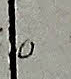0
